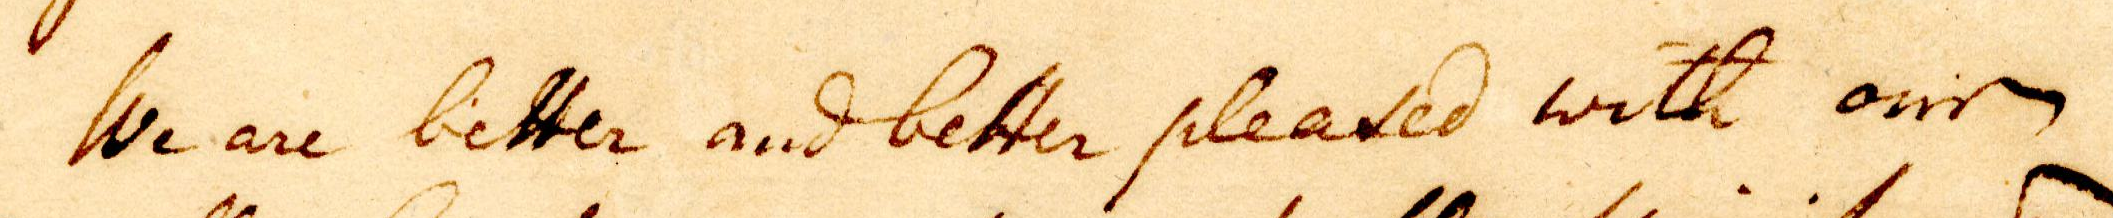We are better and better pleased with our
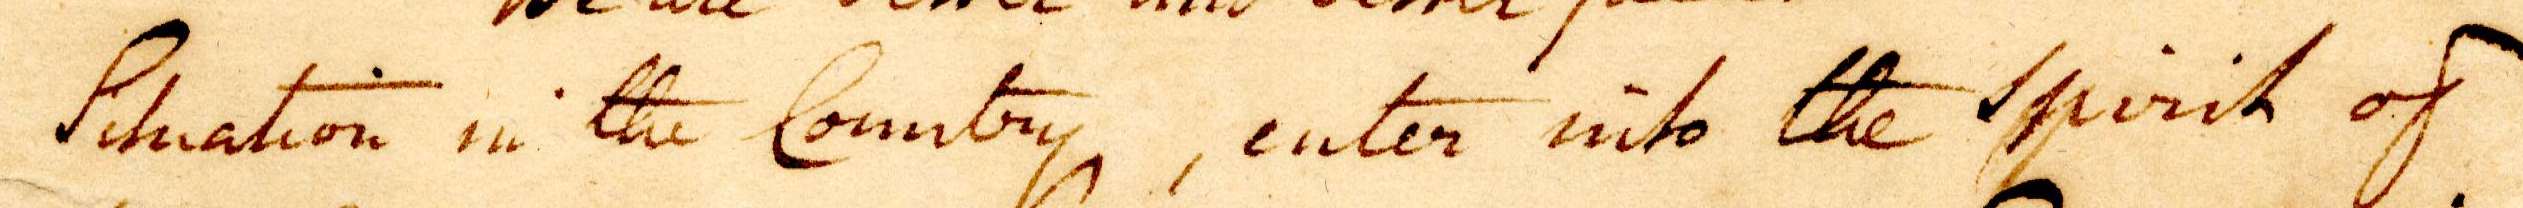Situation in the Country, enter into the spirit of
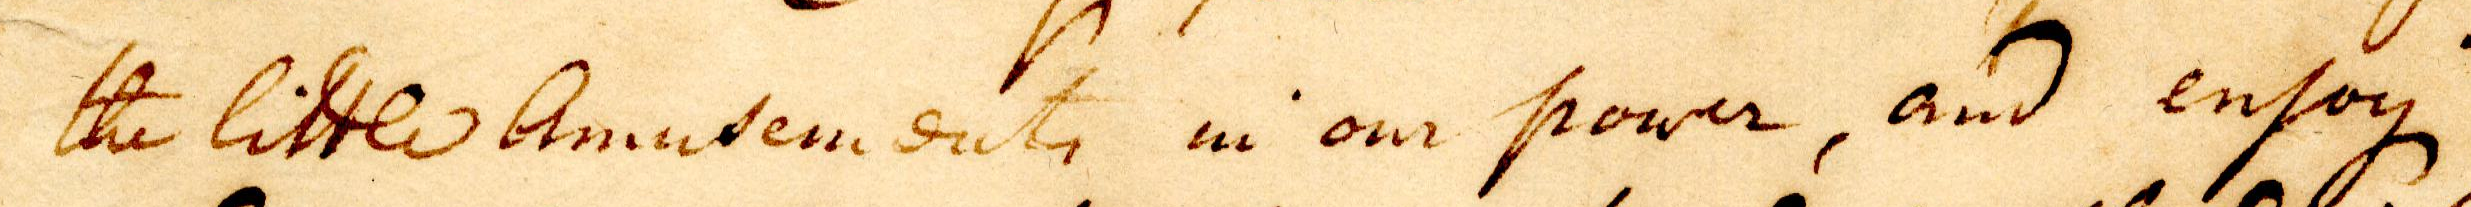the little Amusements in our power, and enjoy
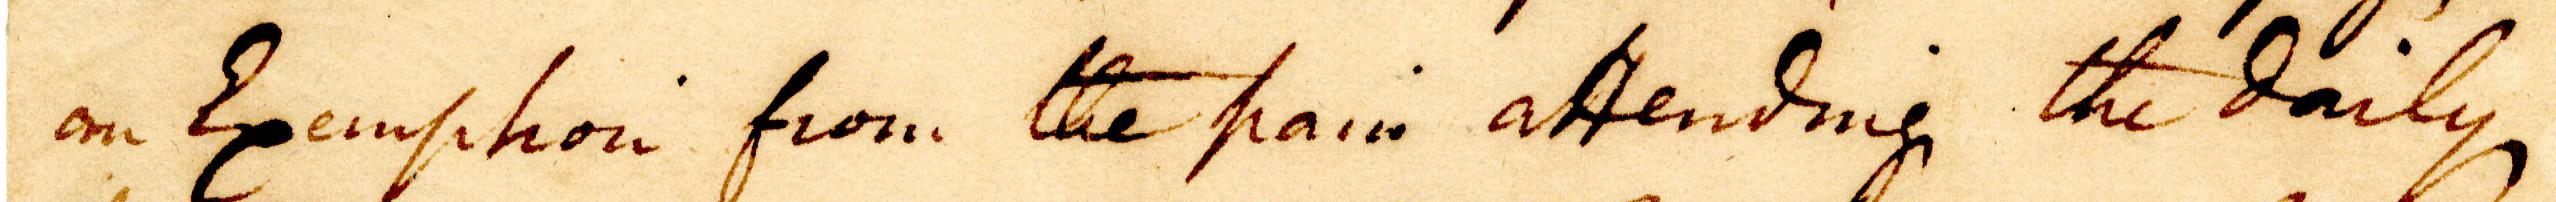an Exemption from the pain attending the daily
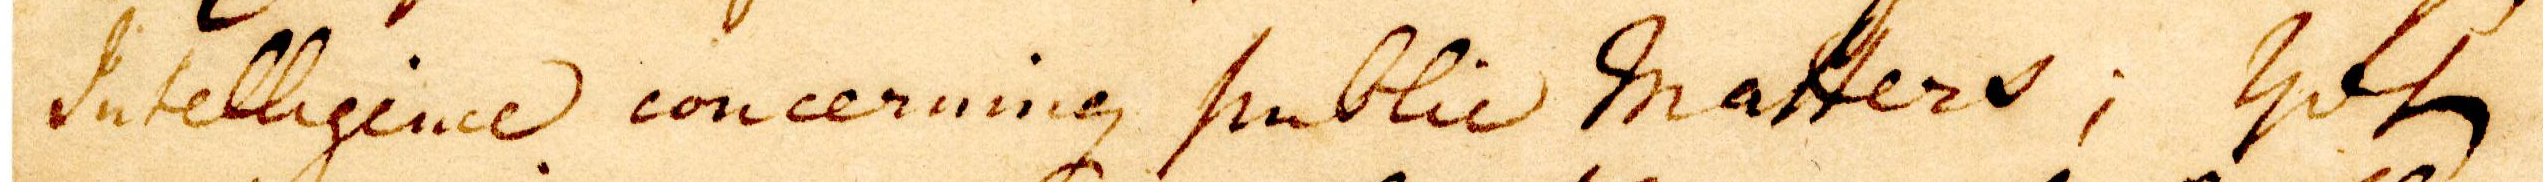Intelligence concerning public matters; You
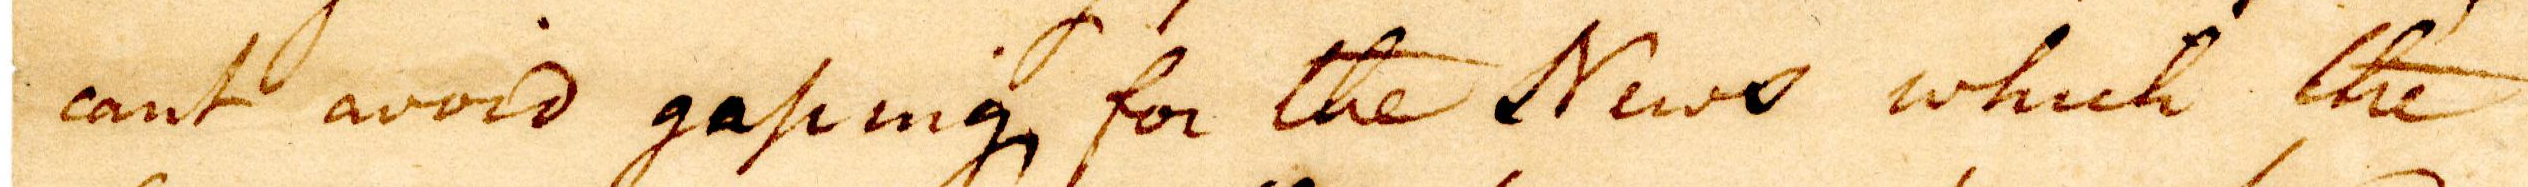cant avoid gaping for the News which the
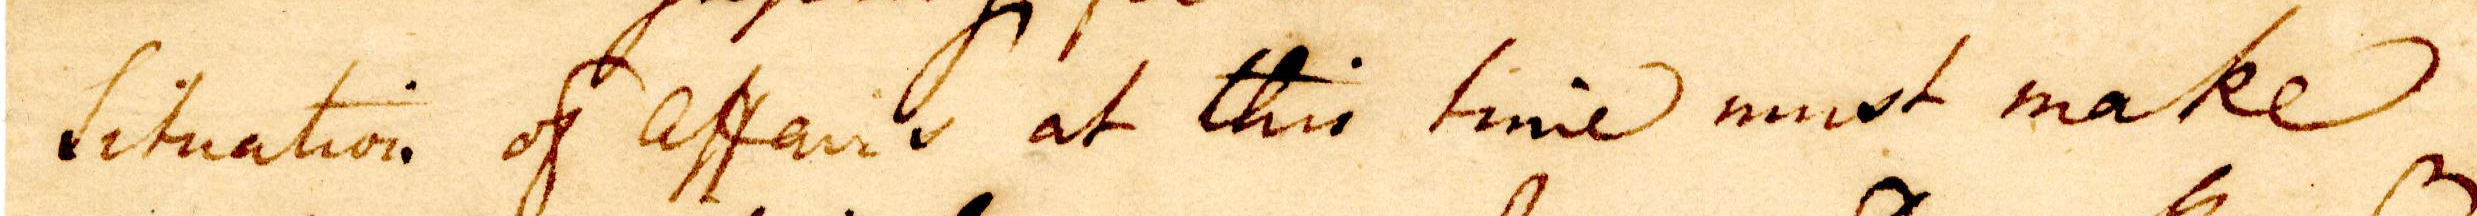Situation of Affairs at this time must make
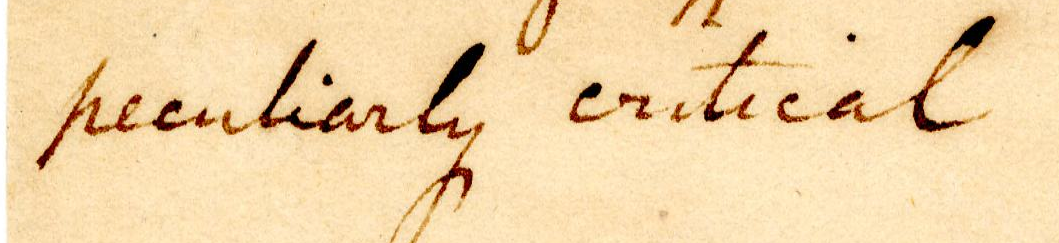peculiarly critical
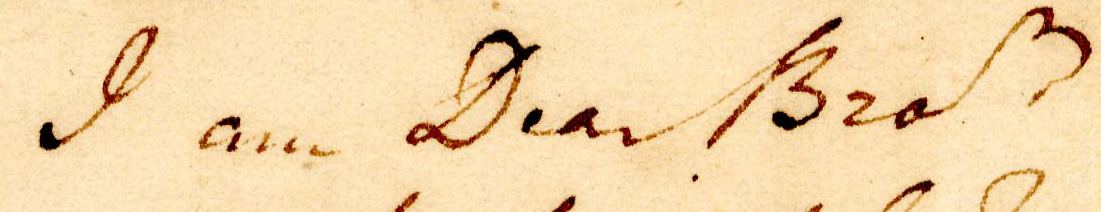I am Dear Bro^r
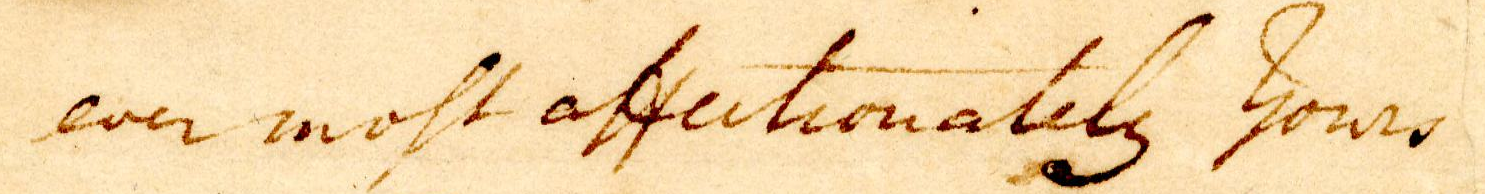ever most affectionately Yours
